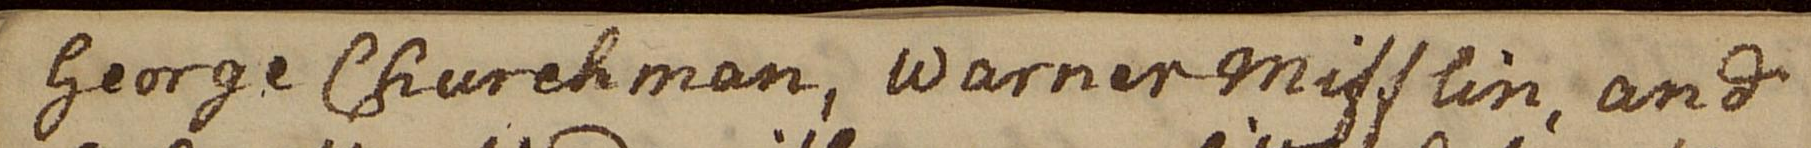George Churchman, Warner Mifflin, and
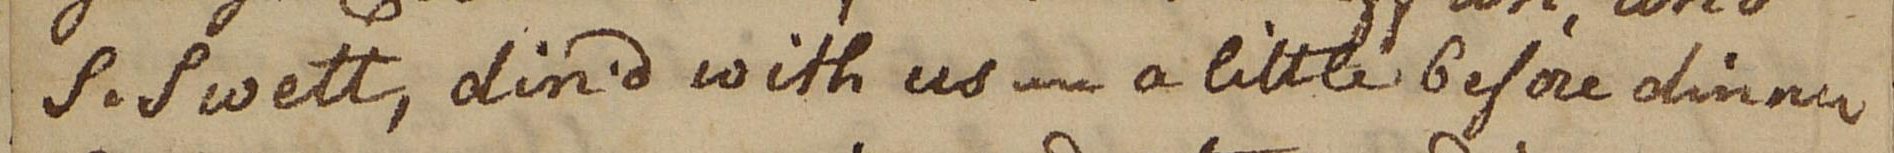S. Swett, din'd with us - a little before dinner
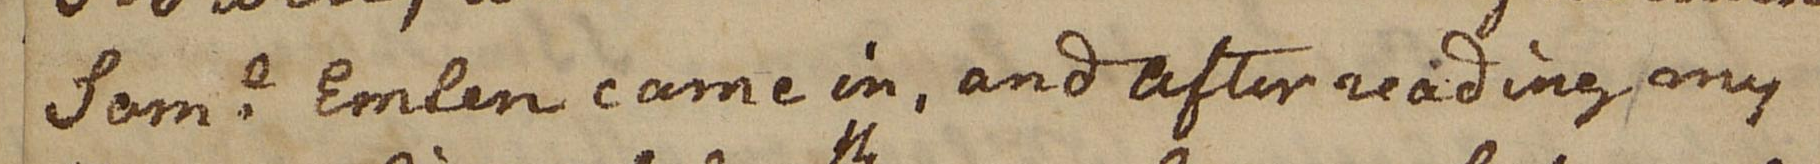Sam^l. Emlen came in, and after reading any
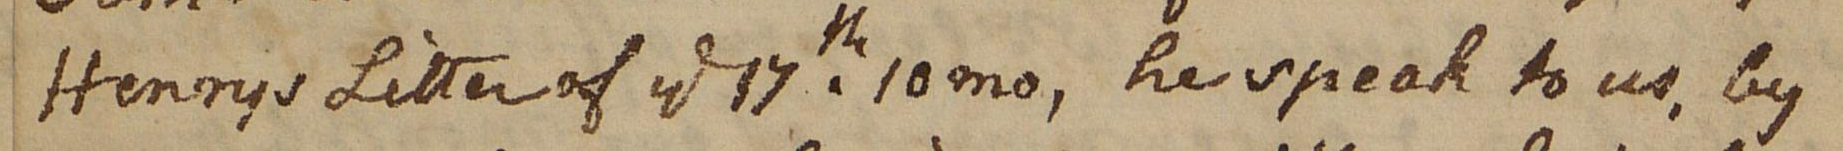Henrys Litter of y^e 17^th 10 mo, he speak to us, by
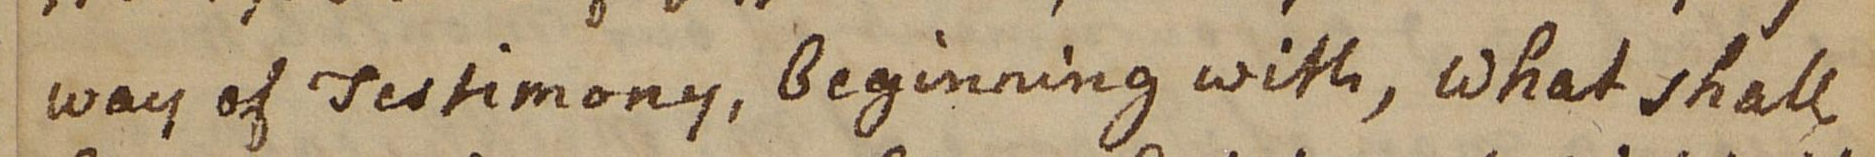way of Testimony, beginning with, what shall
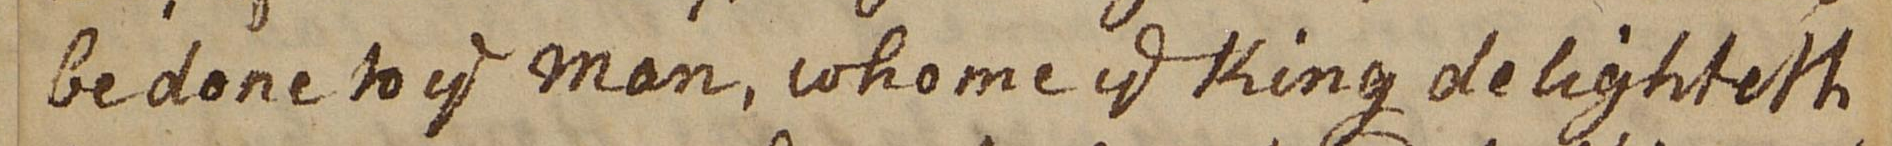be done to y^e man, whome y^e King delighteth
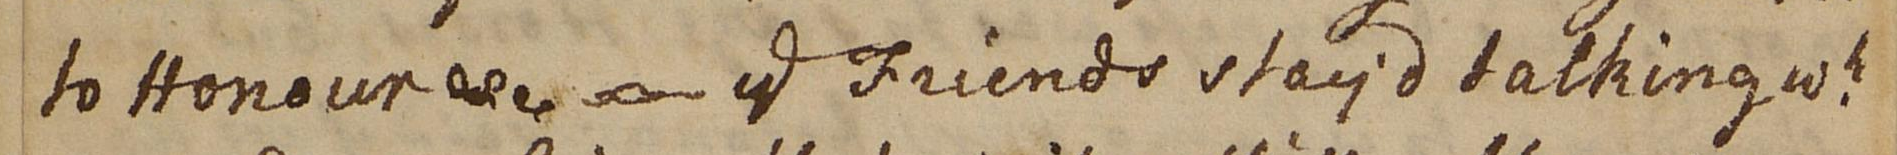to Honour &c- y^e Friends stay'd talking w^h.
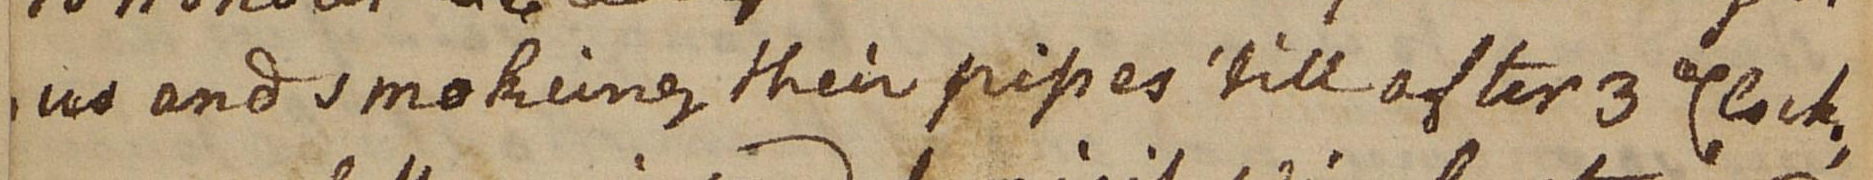us and smokeing their pipes 'till after 3 ^oClock,
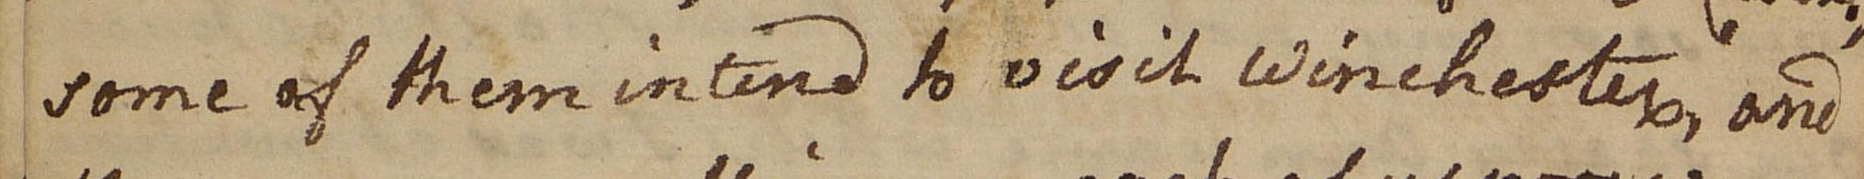some of them intend to visit Winchester, and
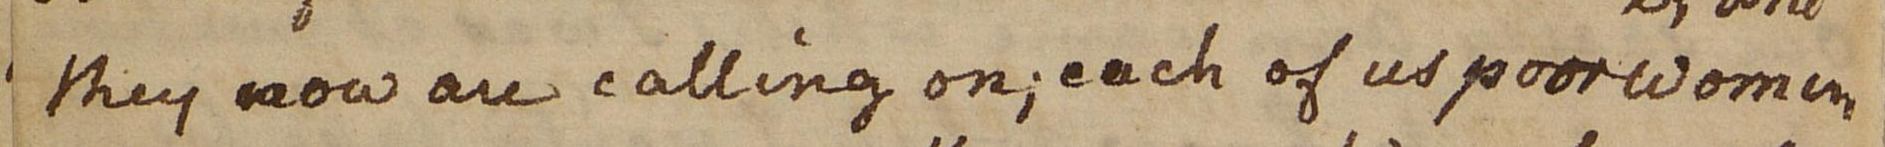they now are calling on; each of us poor women
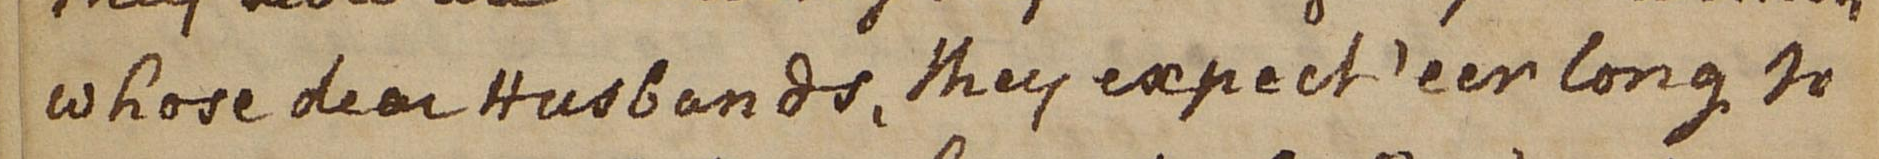whose dear Husbands, they expect 'cer long to
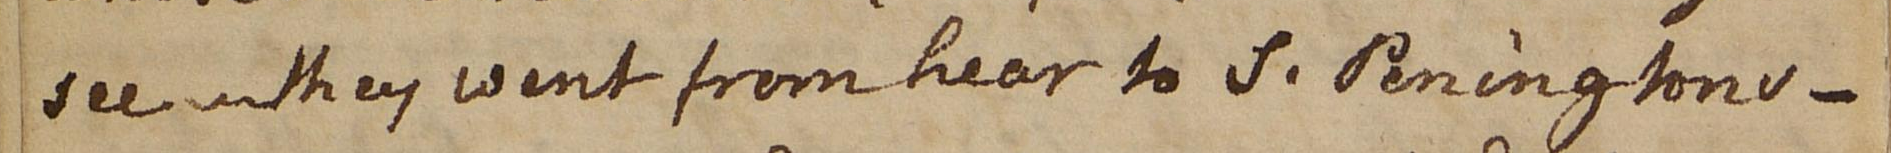see - they went from hear to S. Peningtons-
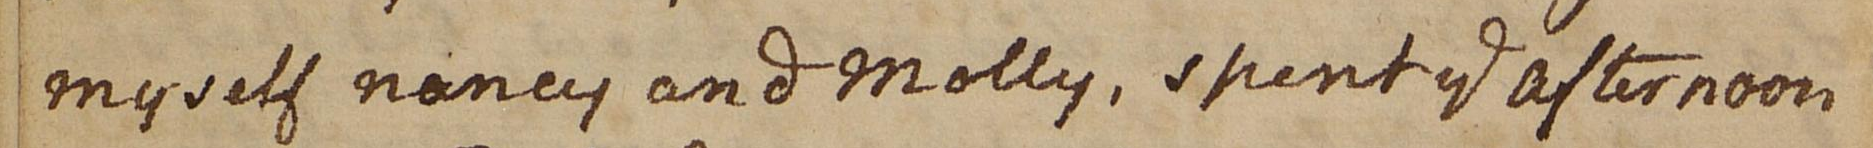myself Nancy and Molly, spent y^e afternoon
